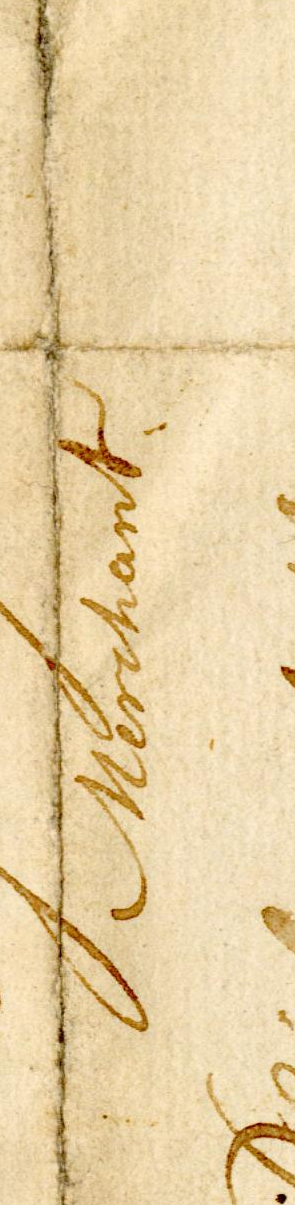Merchant
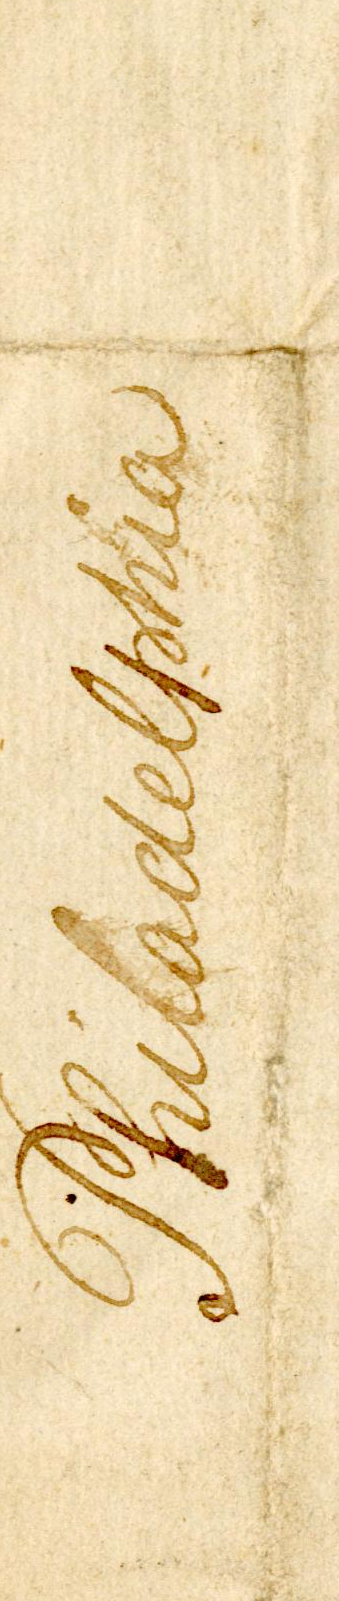Philadelphia
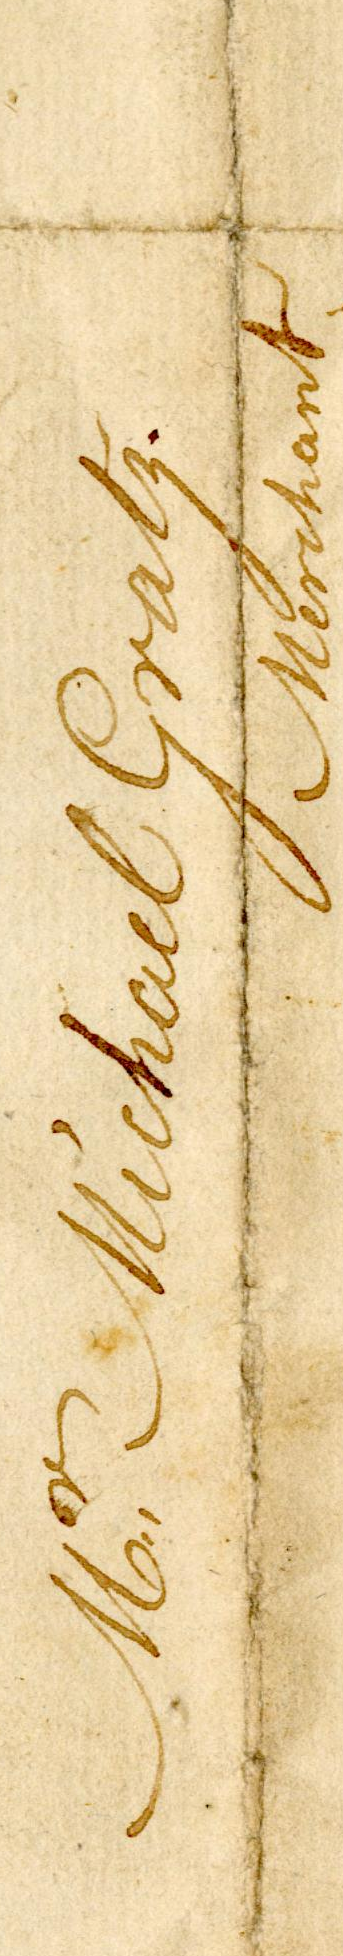M^r Michael Gratz
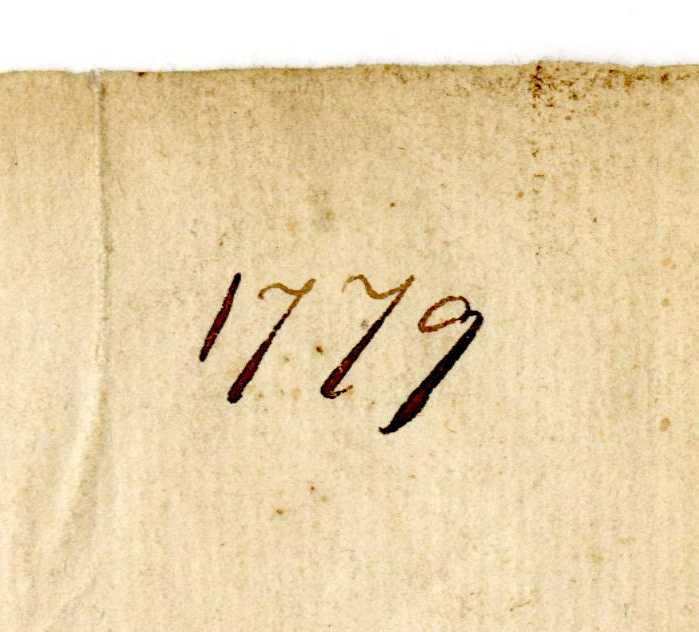1779
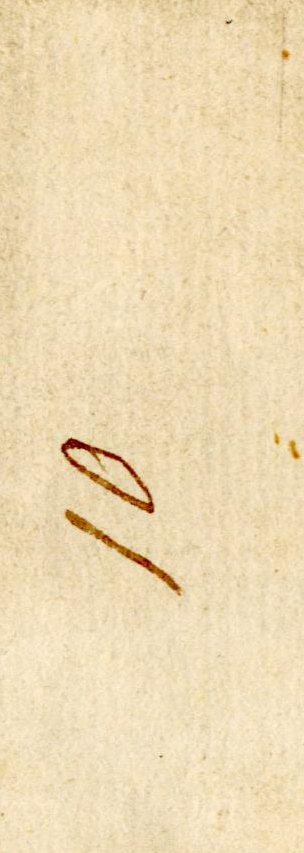10
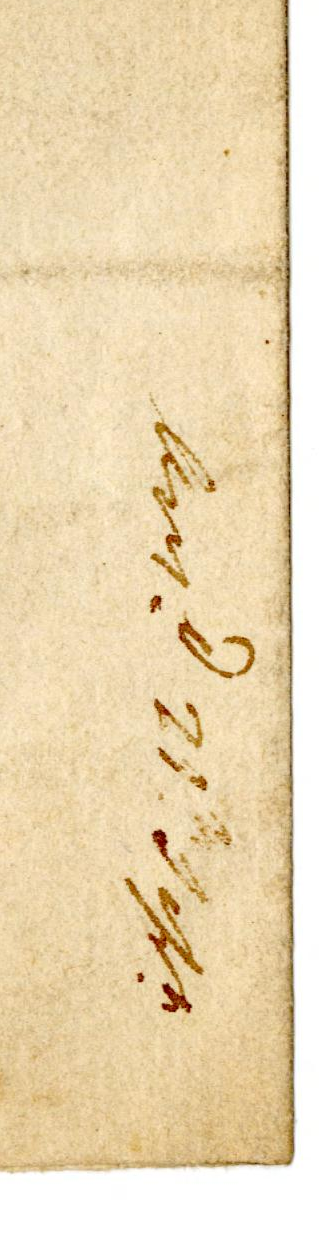Rec^d 21 Sept^r
